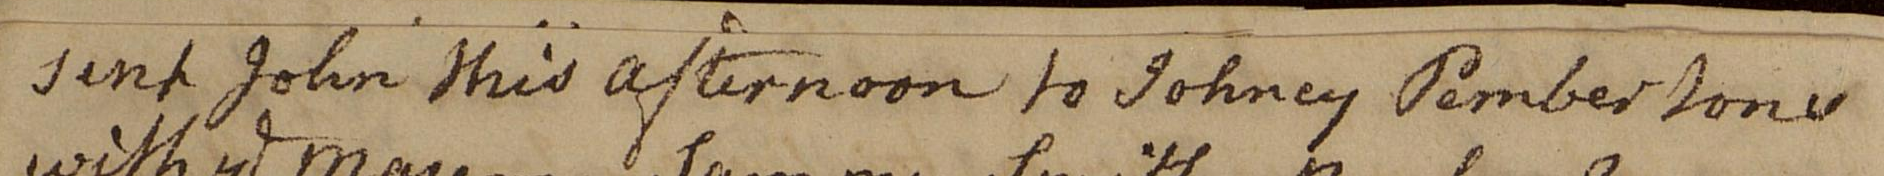sent John this afternoon to Johney Pembertons
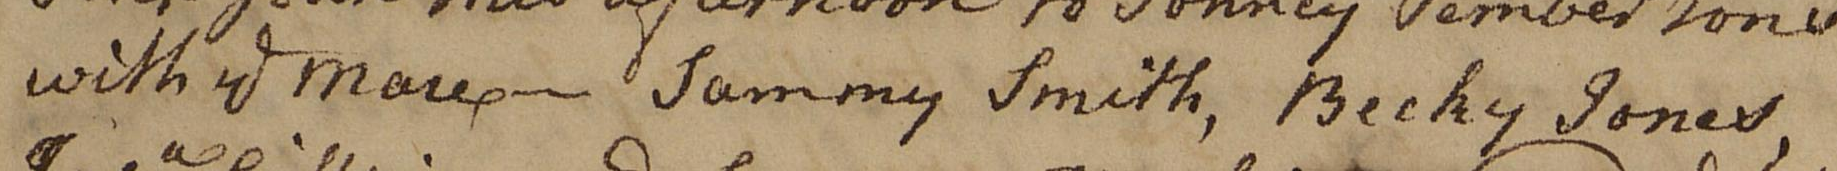with y^e mare-- Sammy Smith, Becky Jones,
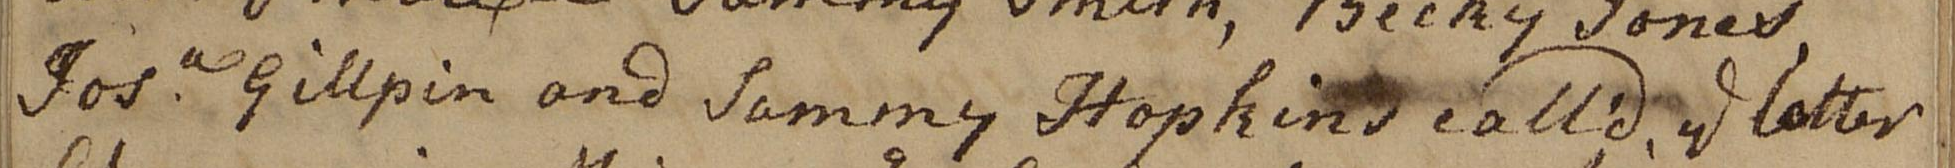Jos^a. Gillpin and Sammy Hopkins call'd, y^e latter
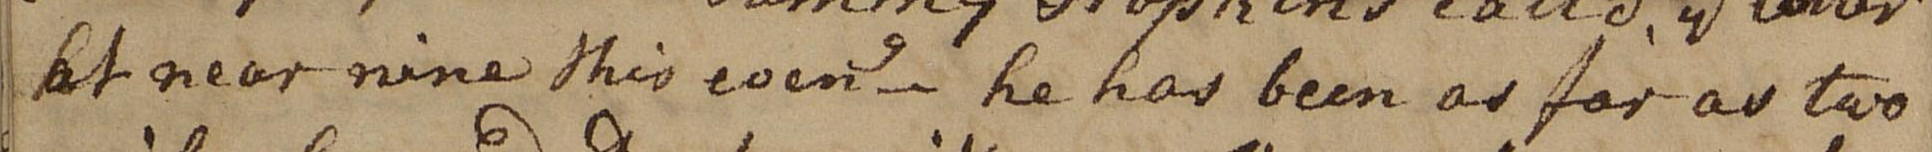at near nine this even^g- he has been as far as two
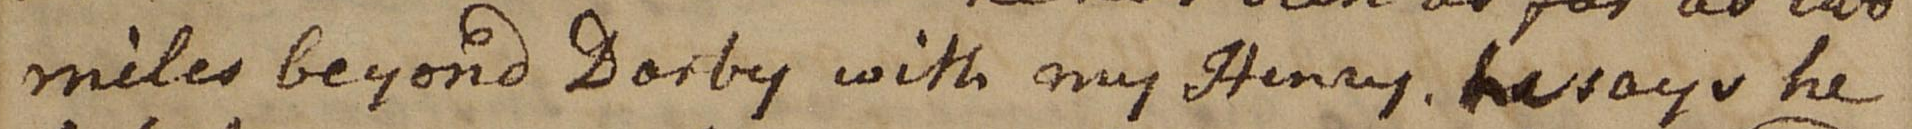miles beyond Darby with my Henry he says he
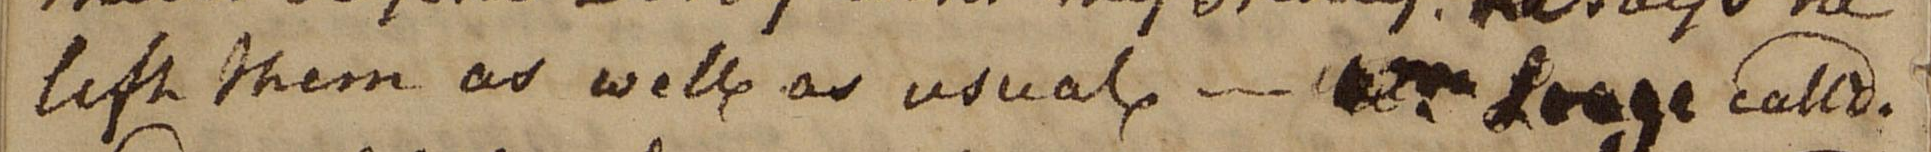left them as well as usual- [W^m. Longe] call'd.
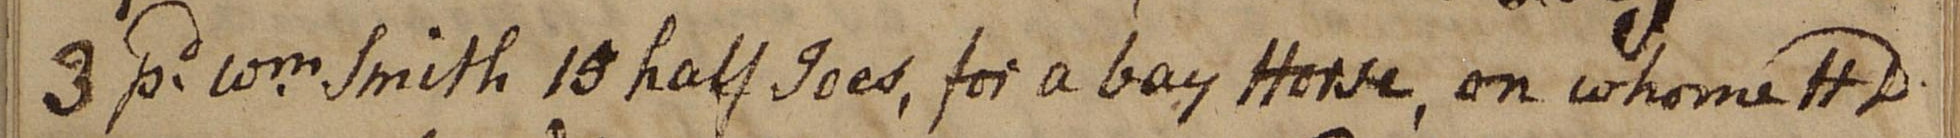3 p^d. W^m. Smith 15 half Joes, for a bay Horse, on whome HD
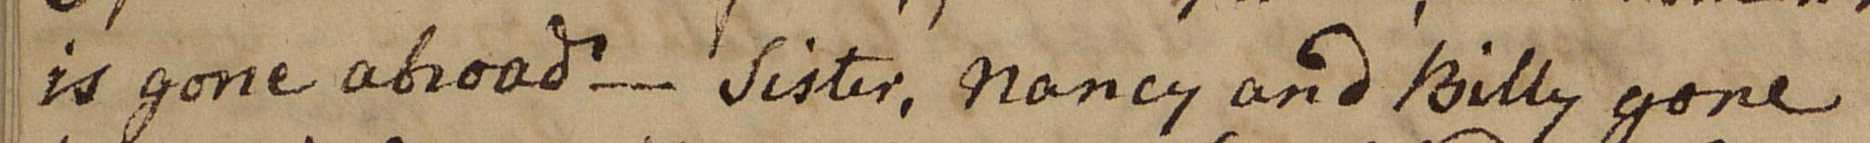is gone abroad- Sister, Nancy and Billy gone
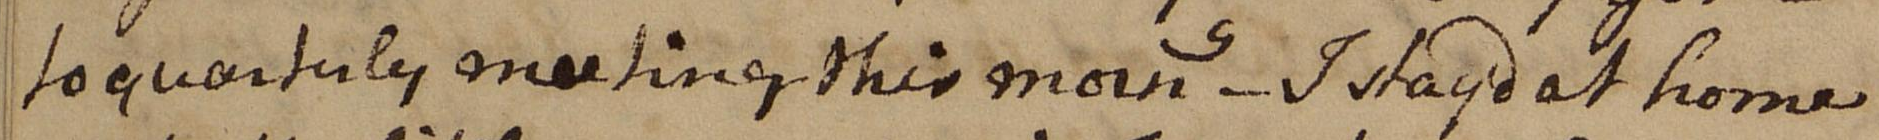to quarterly meeting this morn^g- I stay'd at home
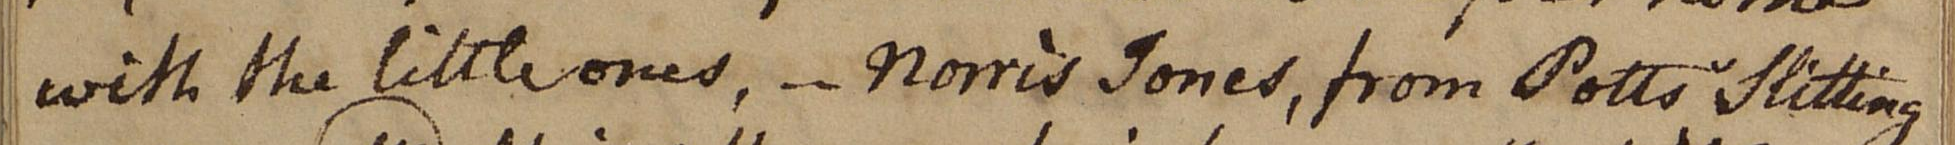with the little ones,- Norris Jones, from Potts Slitting
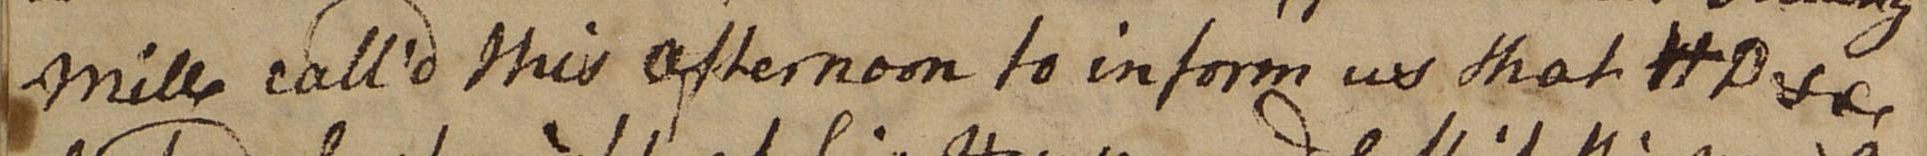-Mill call'd this afternoon to inform us that HD &c
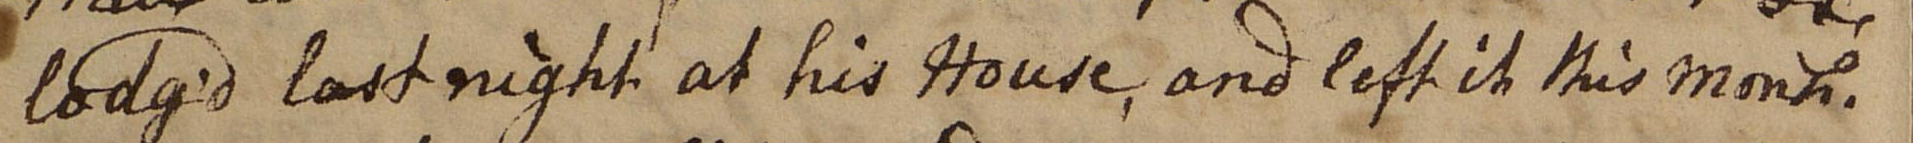lodg'd last night at his House, and left it this morn^g.
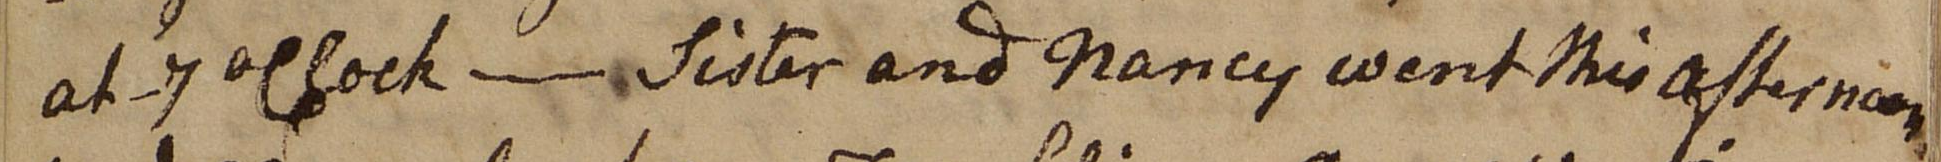at 7 ^oClock- Sister and Nancy went this afternoon
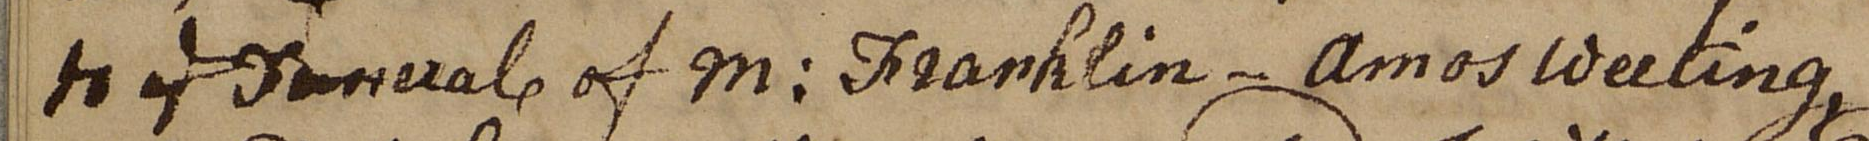to y^e Funeral of M: Franklin- Amos Weeting,
